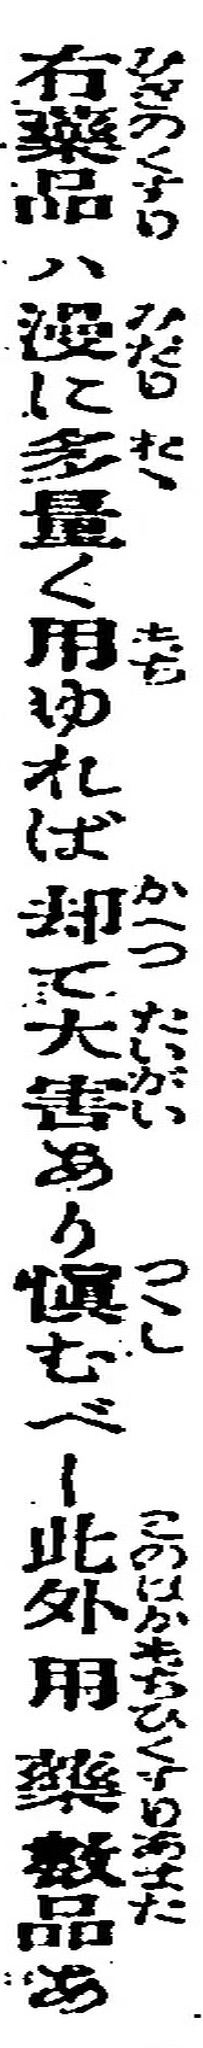右藥品は漫に多量く用ゆれば却て大害あり慎むべし此外用藥數品あ
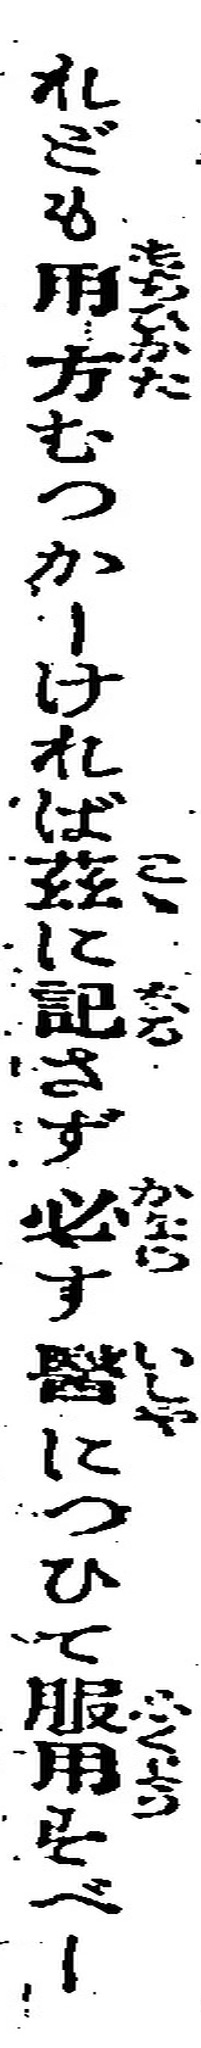れども用方むつかしければ茲に記さず必す醫につひて服用すべし
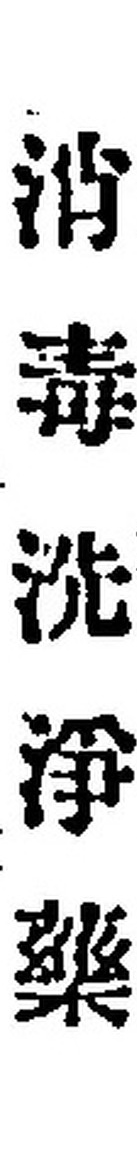消毒洗浄藥
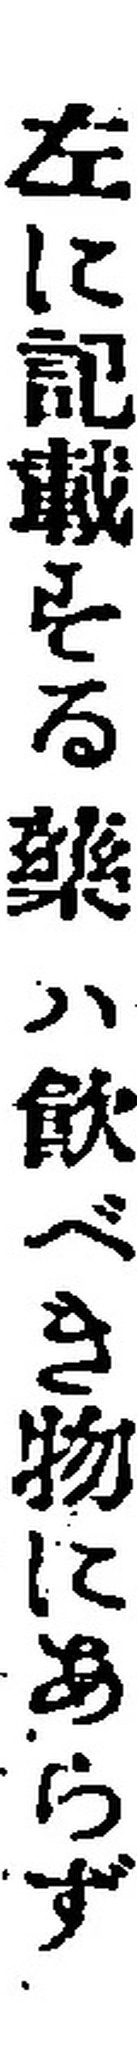左に記載する藥は飲べき物にあらず
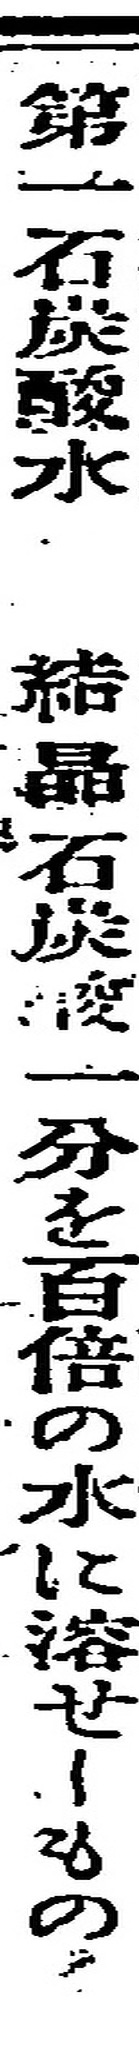第一石炭酸水結晶石炭酸一分を百倍の水に溶せしもの
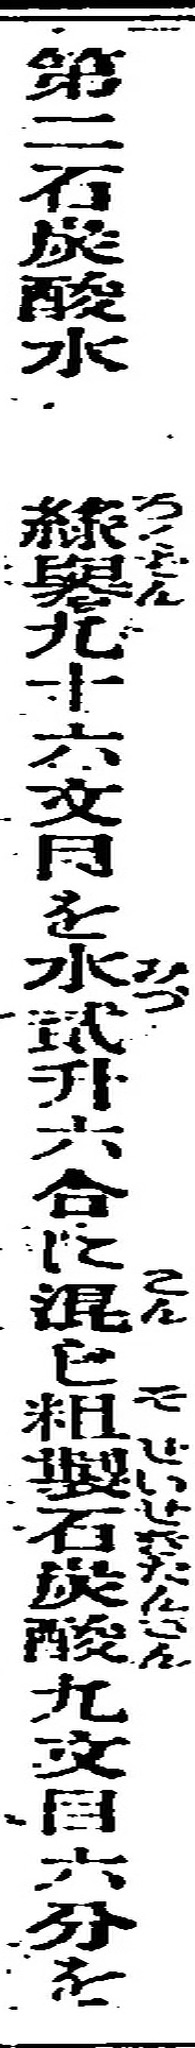第二石炭酸水緑蕃九十六文目を水貳升六合に混じ蘇生石炭酸九文目六分を
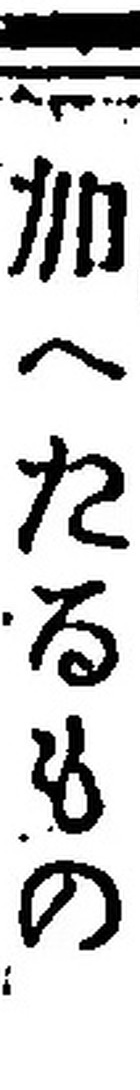加へたるもの
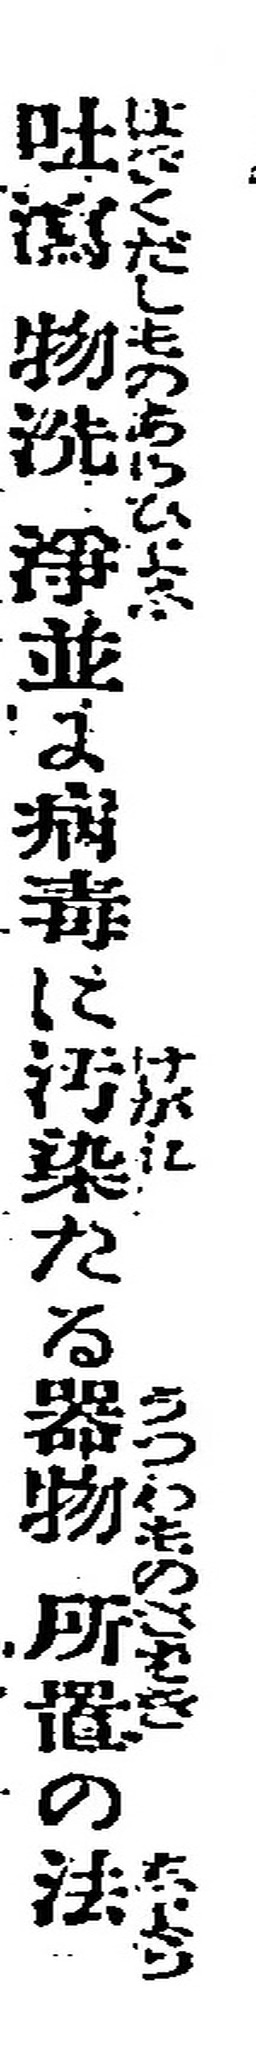吐瀉物洗浄並に病毒に汚染たる器物所置の法
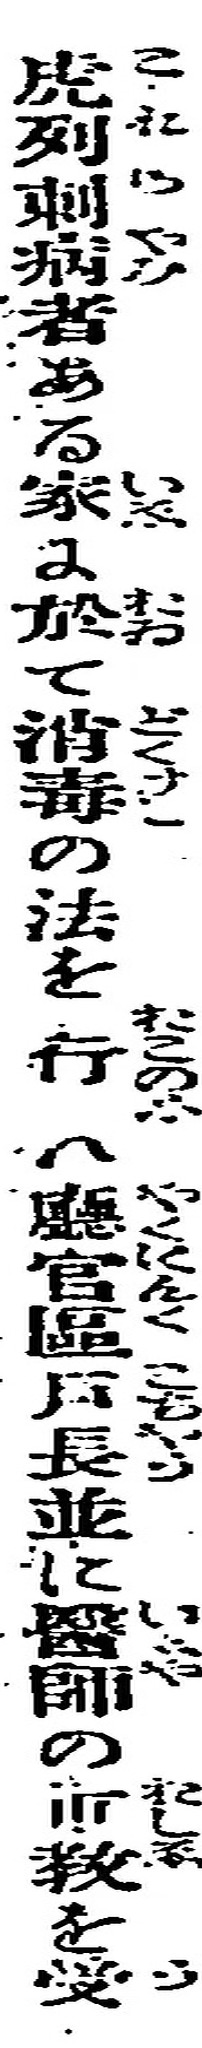虎列刺病者ある家に於て消毒の法を行は廰官區戸長並に醫師の布教を受
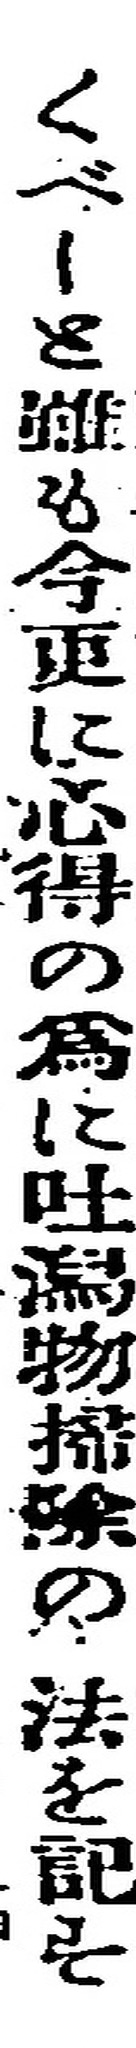くべしと雖も今更に心得の為に吐瀉物掃除の法を記す

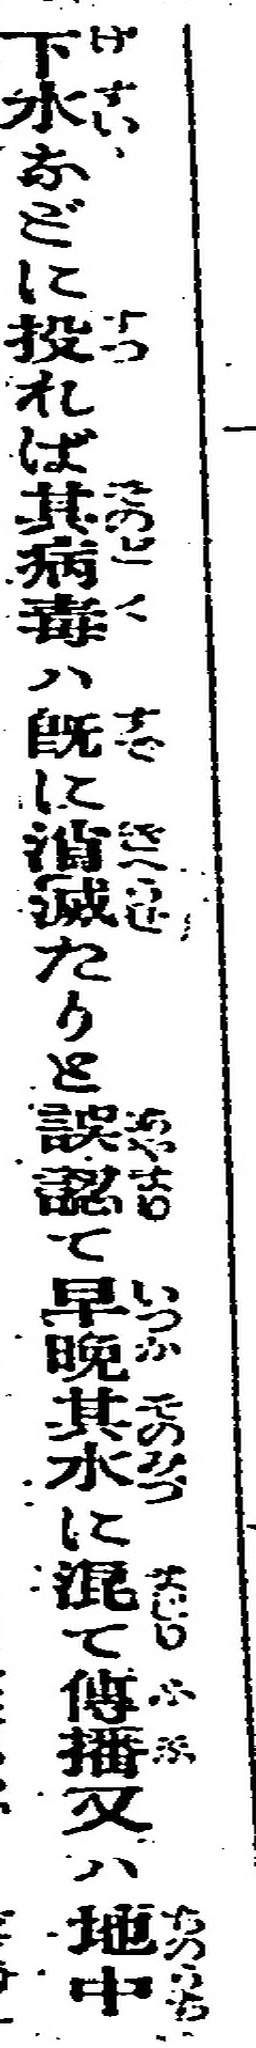下水などに投れば其病毒は既に消滅たりと誤認て早晩其水に混て伝播又は地中
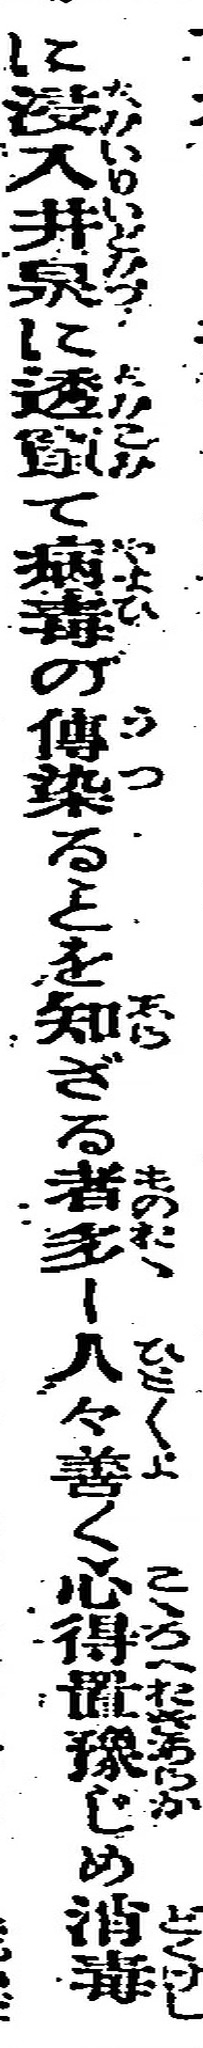に侵入井泉に透鼠て病毒の傳染ることを知ざる者多し人々善く心得置豫じめ消毒
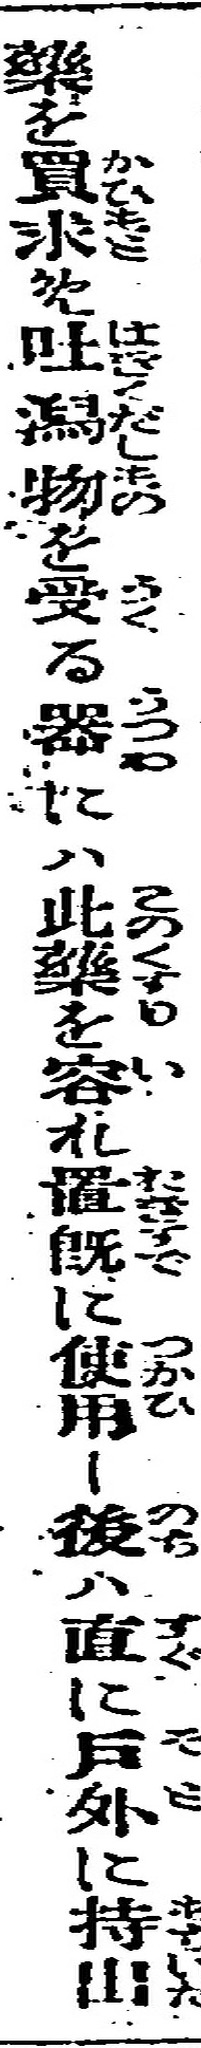藥を買求め吐瀉物を受る器には此藥を容れ置既に使用し後は直に戸外に持出
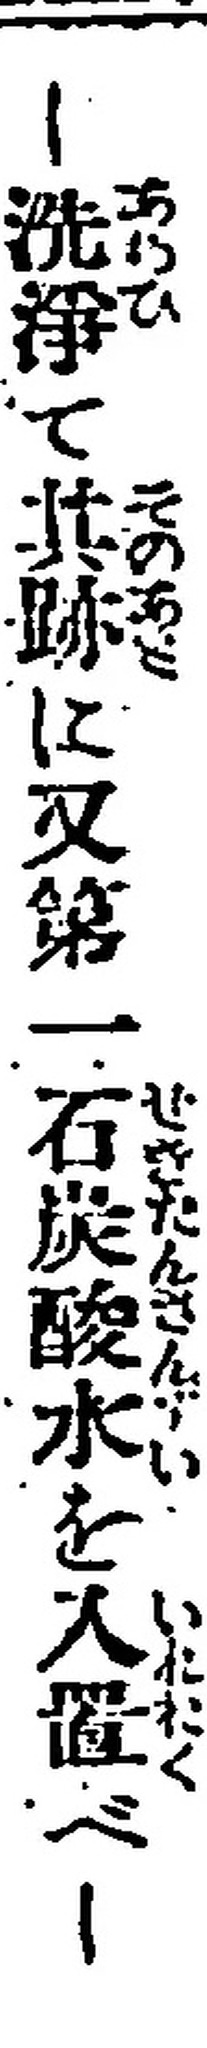し洗浄て其後に又第一石炭酸水を入置べし
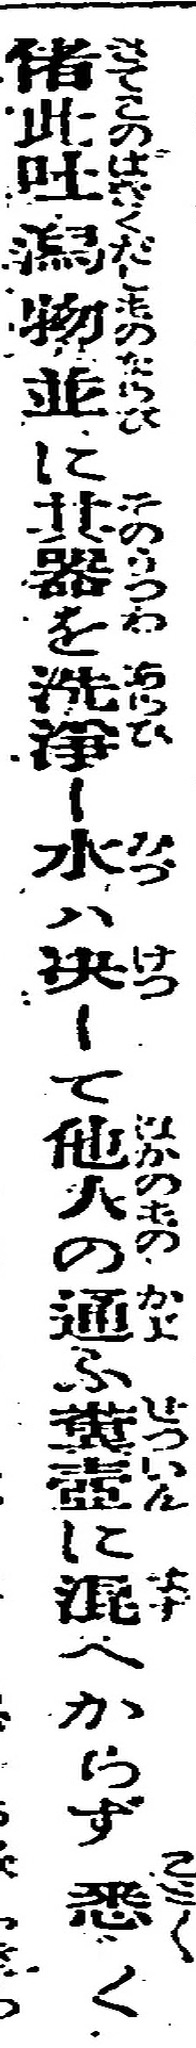偖此吐瀉物並に其器を洗浄し水は決して他人の通ふ糞壺に混へからず悉く
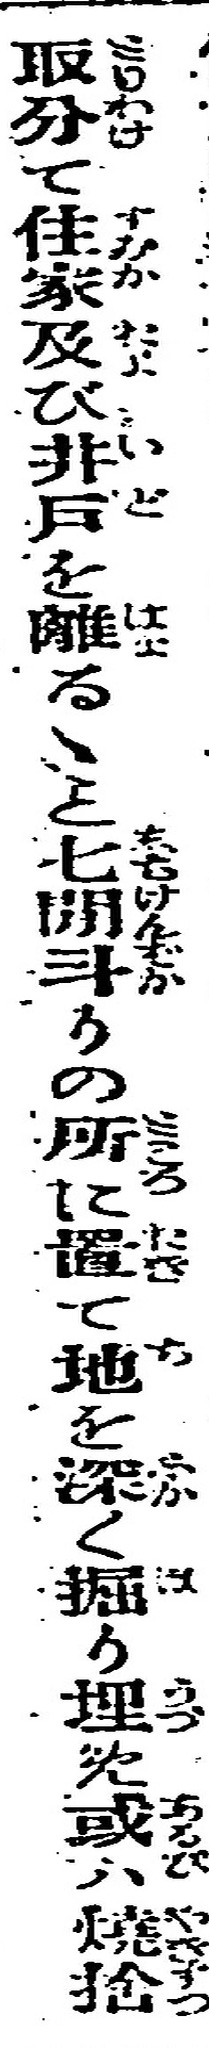取分て住家及よび井戸を離るゝこと七間斗りの所に置て地を深く堀り埋め或は焼捨
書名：虎列剌病予防養生法訳解
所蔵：国立国会図書館 National Diet Library, JAPAN
